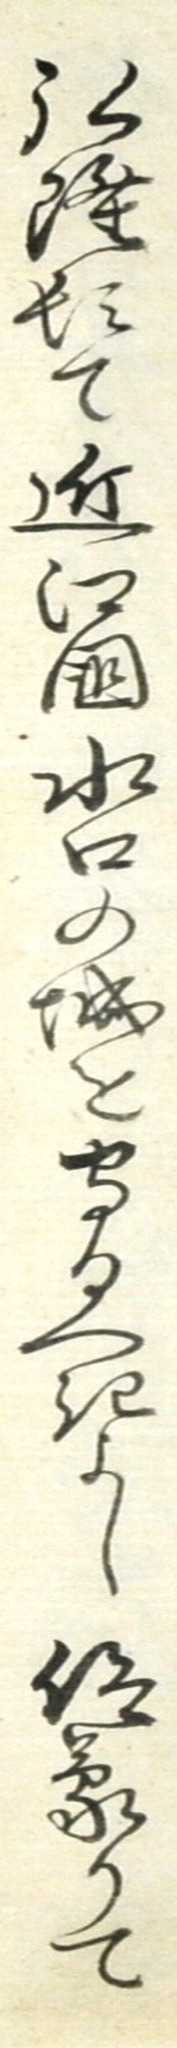弘隆頓て近江国水口の城を守るへきよし仰蒙りて
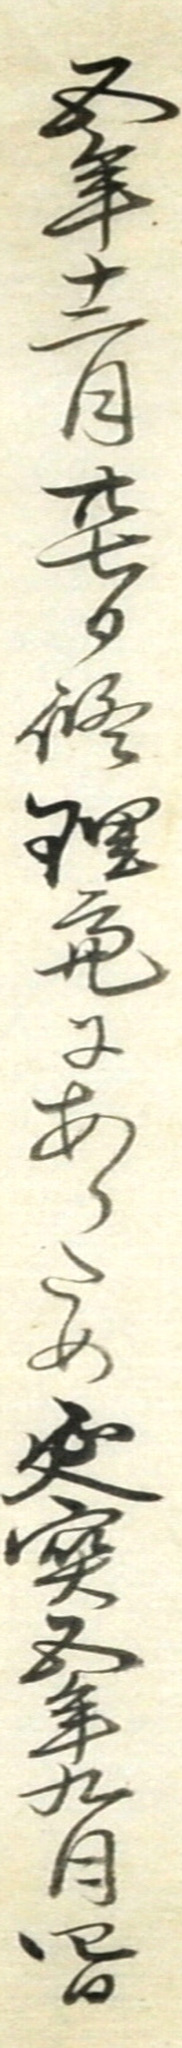五年十二月廿七日修理亮にあらため延宝五年九月四日
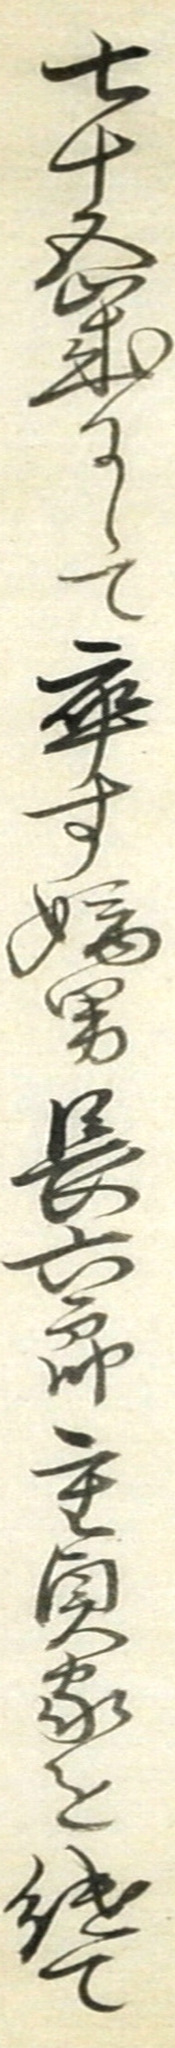七十五歳にして卒す嫡男長六郎重貞家を継て
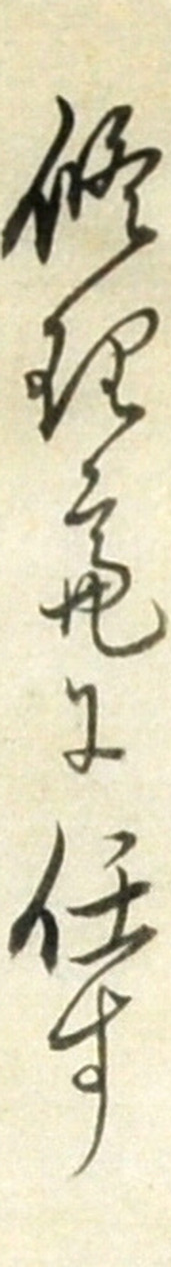修理亮に任す

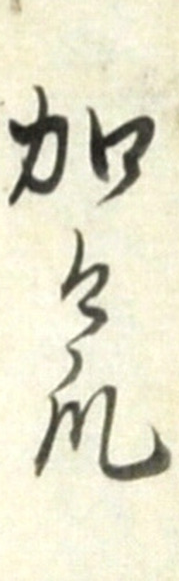加々爪
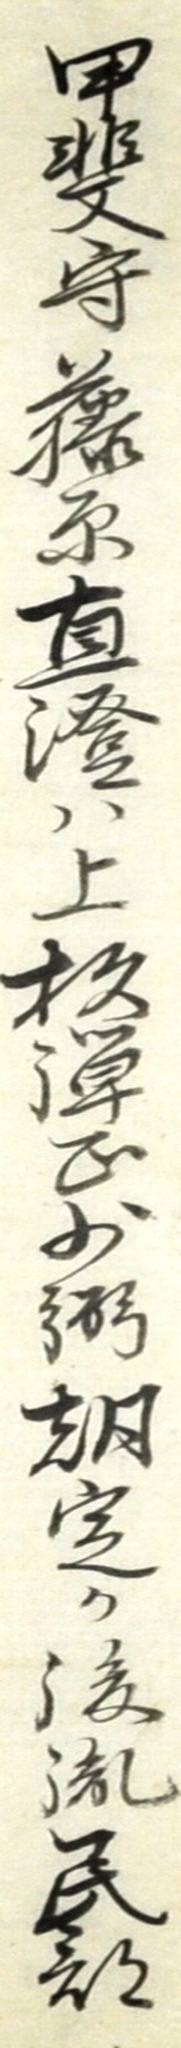甲斐守藤原直澄は上杉弾正少弼朝定か後胤民部
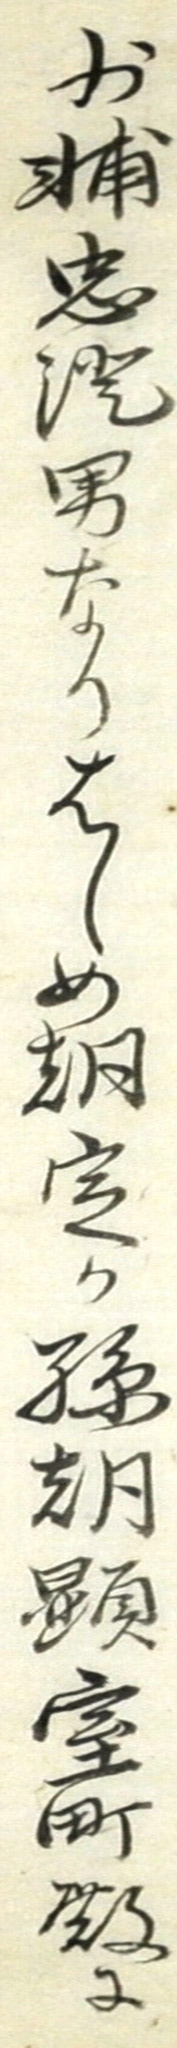少輔忠澄男なりはしめ朝定か孫朝顕室町殿に
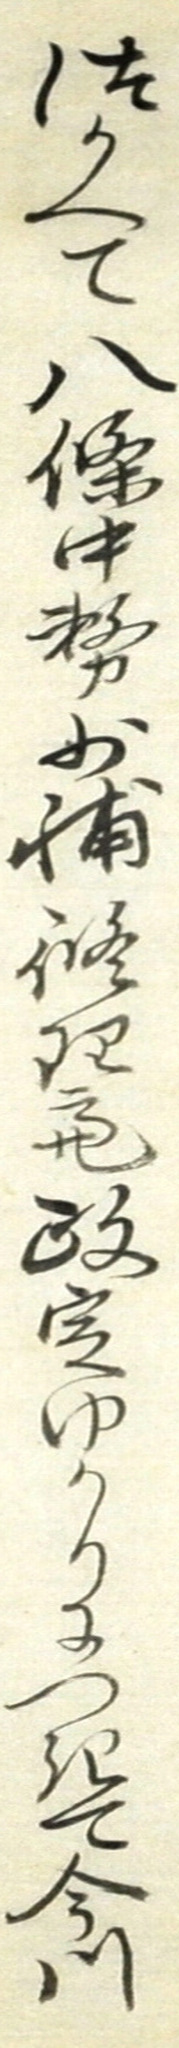つかへて八条中務少輔修理亮政定ゆかりにつきて今川
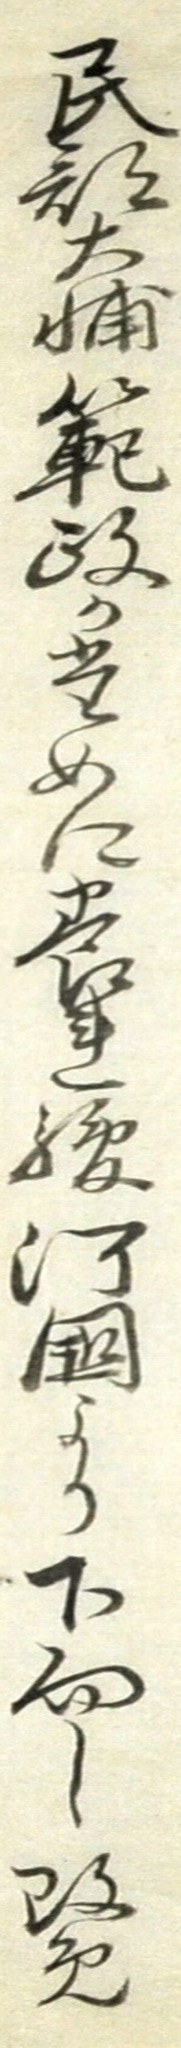民部大輔範政かために養れ駿河国より下向し改め
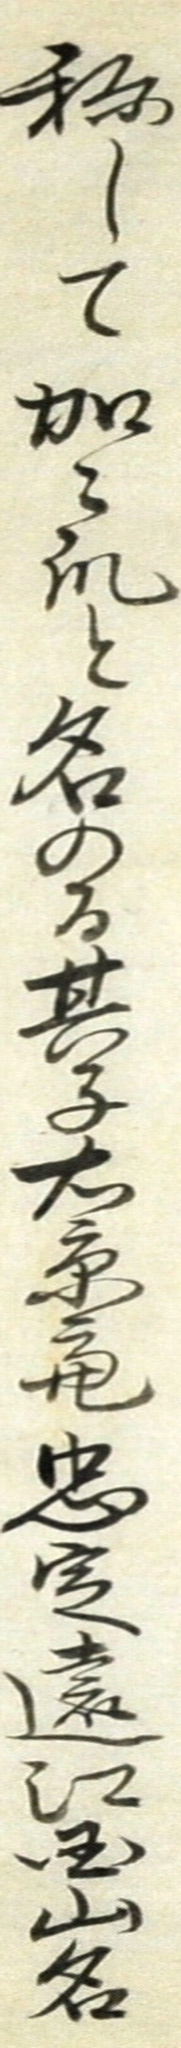称して加々爪と名のる其子右京亮忠定遠江国山名
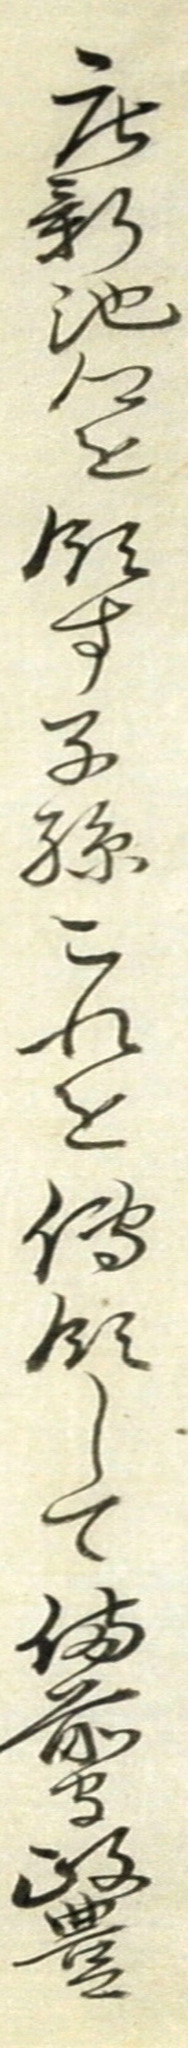庄新池郷を領す子孫これを伝領して備前守政豊
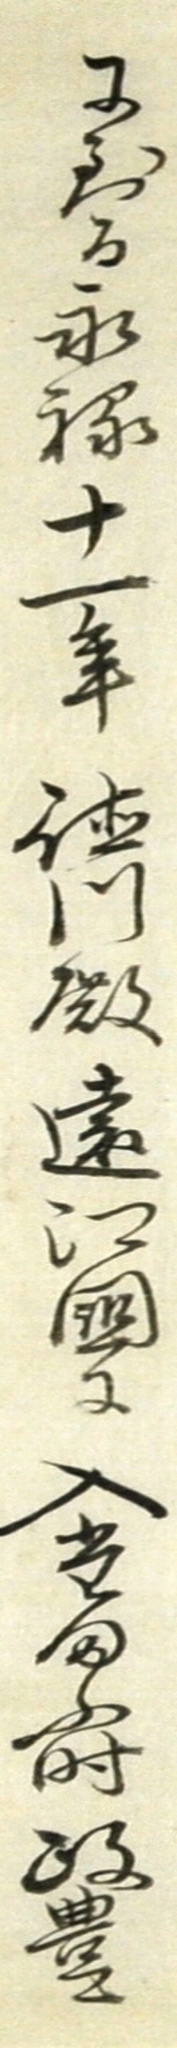に到る永禄十一年徳川殿遠江国に入たまふ時政豊
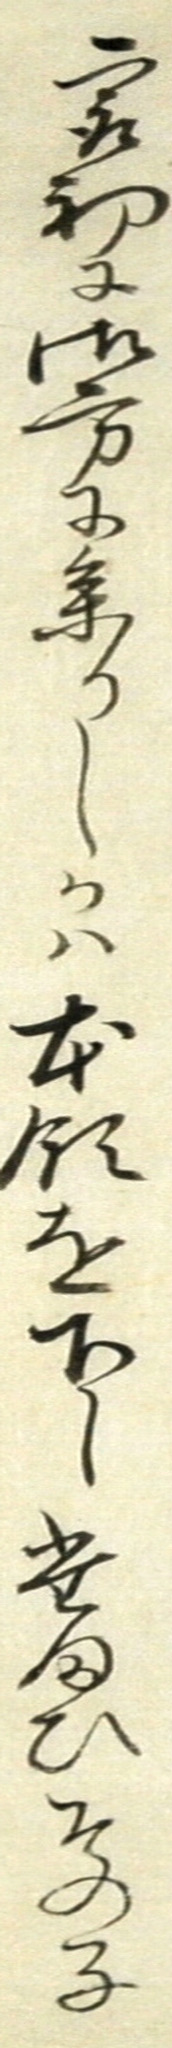最初に御方に参りしかは本領を下したまひその子
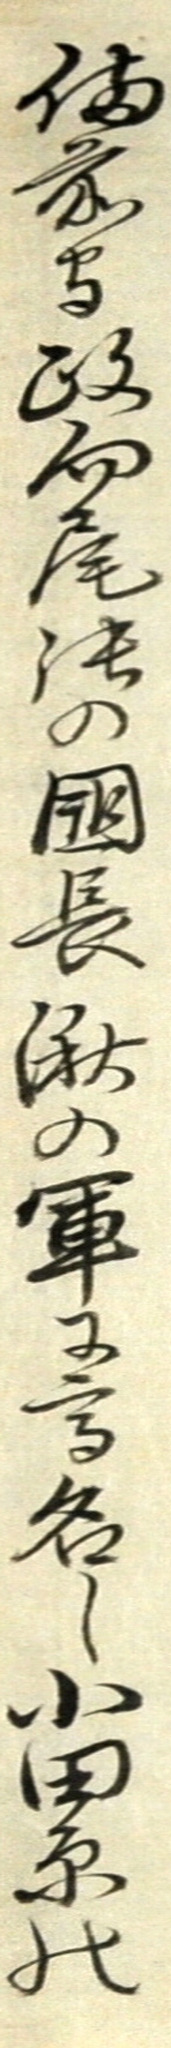備前守政向尾張の国長湫の軍に高名し小田原の

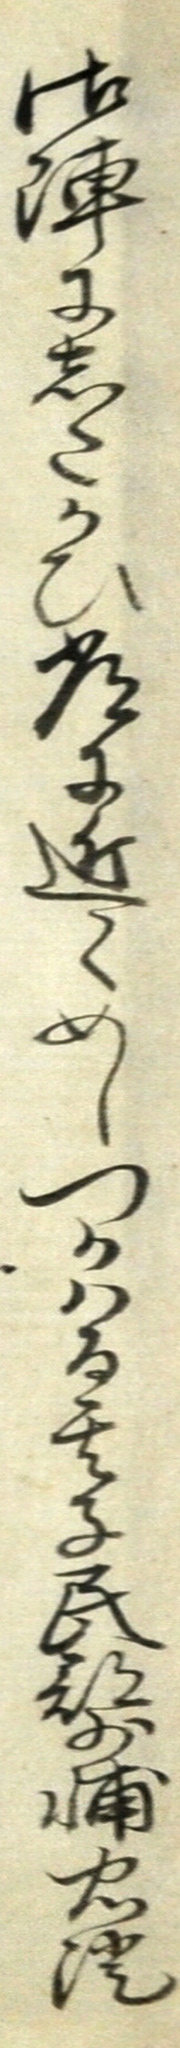御陣にしたかひ常に近くめしつかはる其子民部少輔忠澄
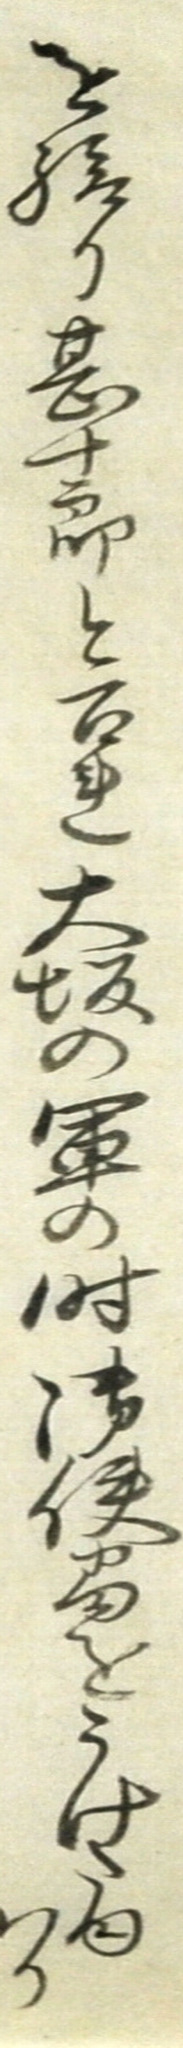を給り甚十郎と召れ大坂の軍の時御使番をうけたまはり
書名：藩翰譜（六）
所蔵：伊那市立高遠町図書館・合同会社AMANE
